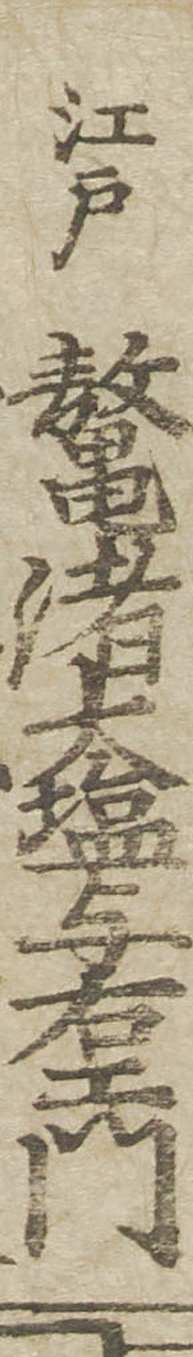同江戸鼇渚大塩与右エ門
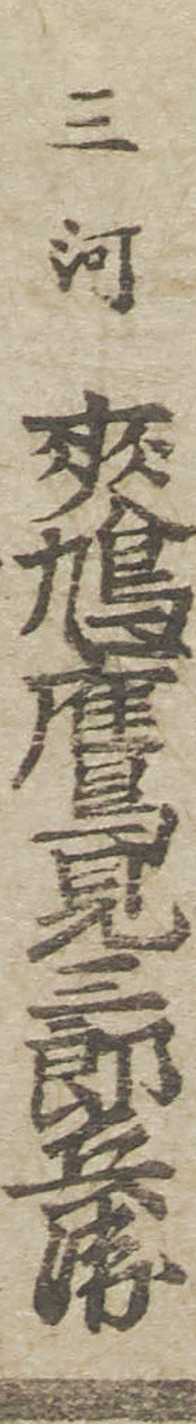同三河爽鳩鷹見三郎兵衛
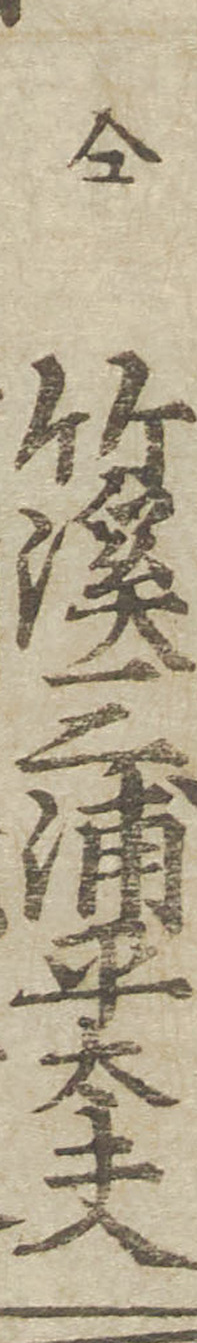同仝竹溪三浦平太夫
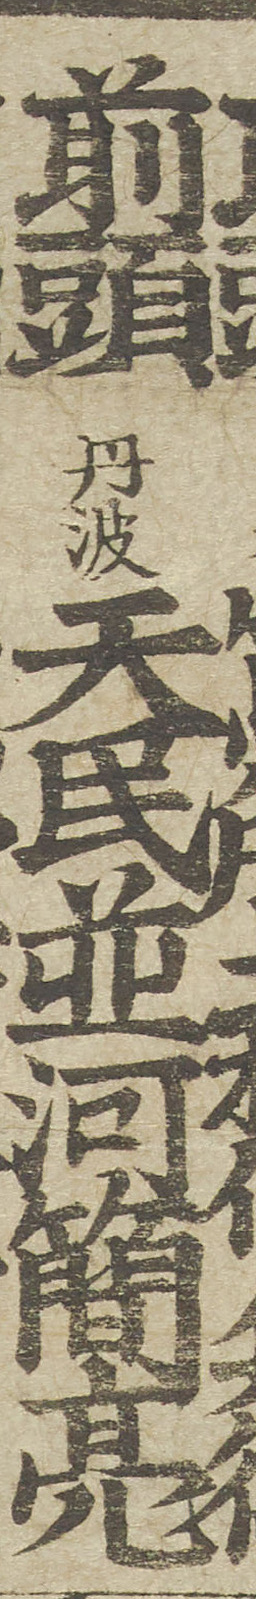前頭丹波天民並河簡亮
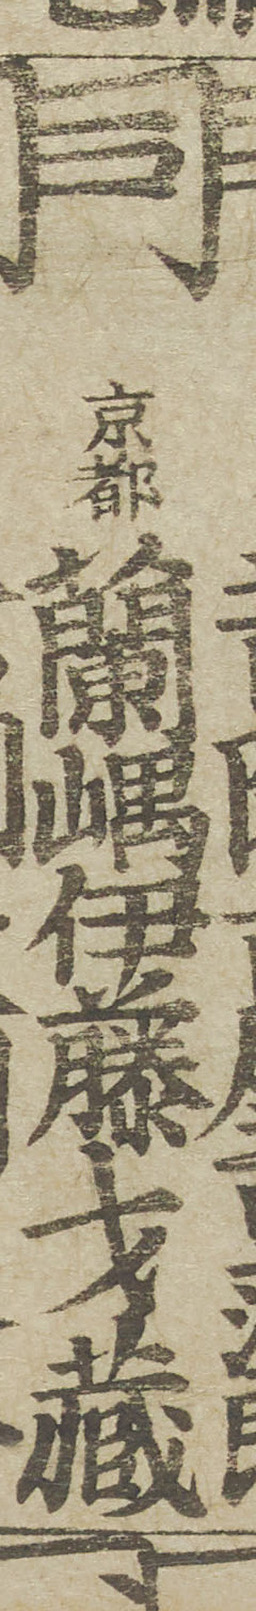同京都蘭嵎伊藤才蔵
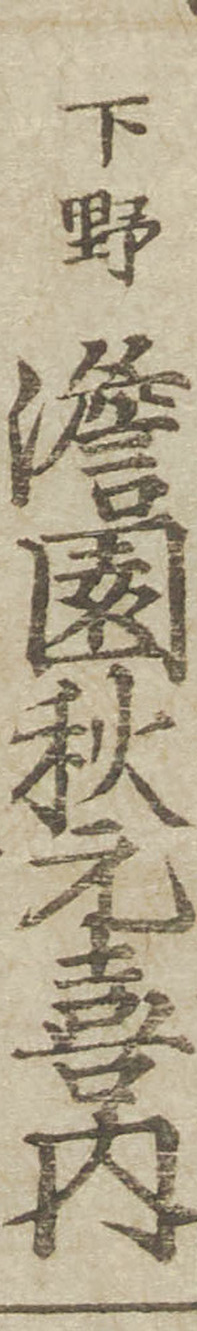同下野澹園秋元喜内
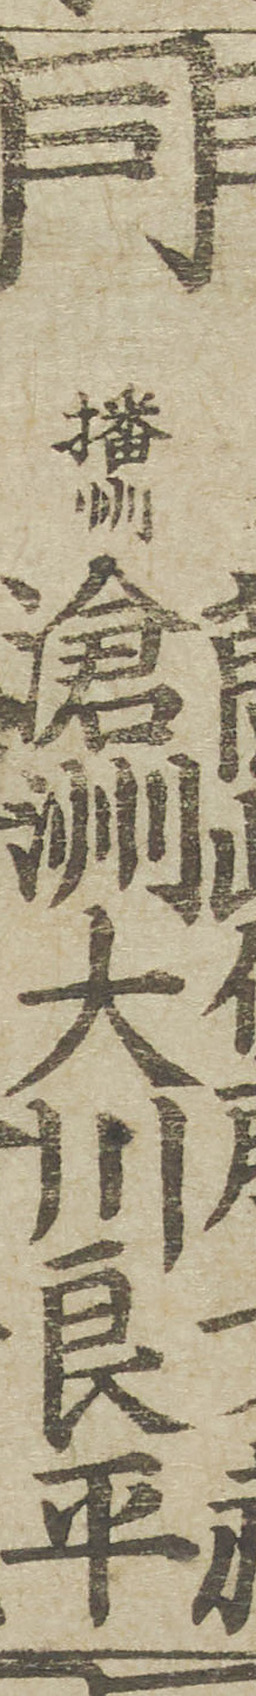同播州滄洲大川良平
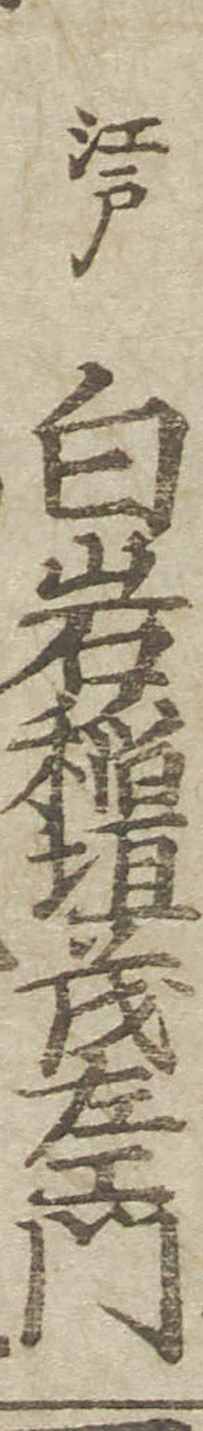同江戸白岩稲垣茂左エ門
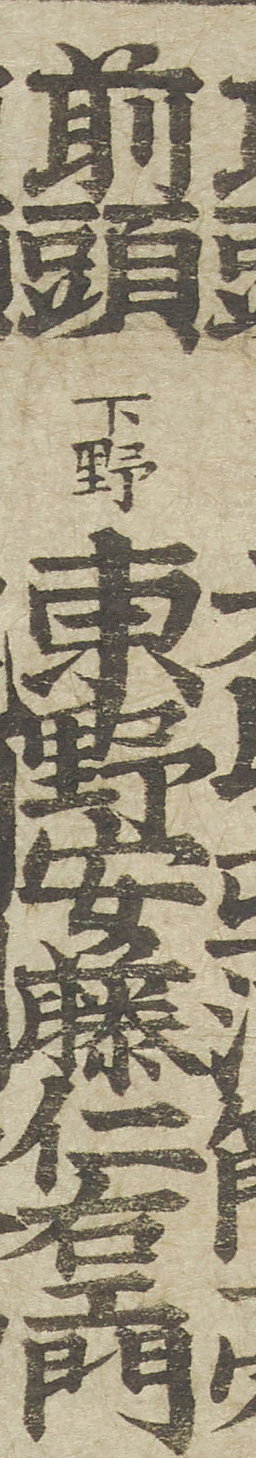前頭下野東野安藤仁右エ門
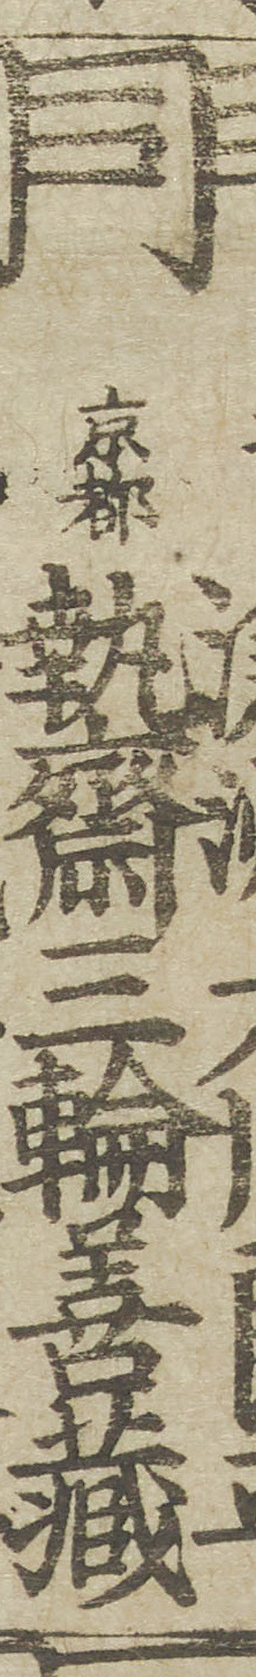同京都執斎三輪善蔵
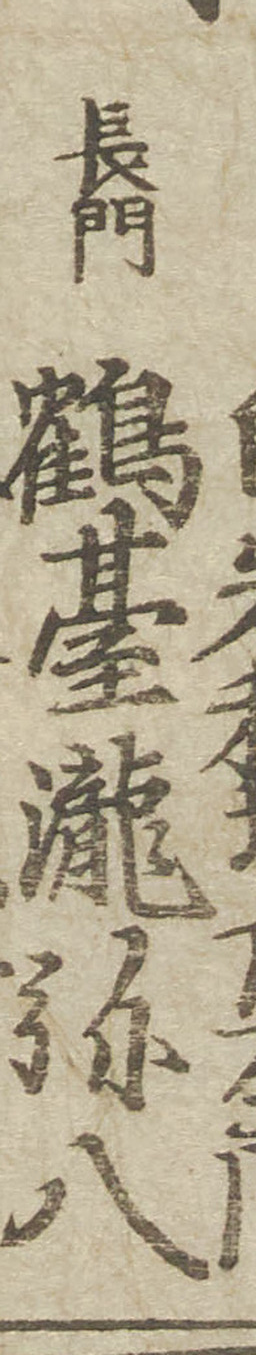同長門鶴臺瀧弥八
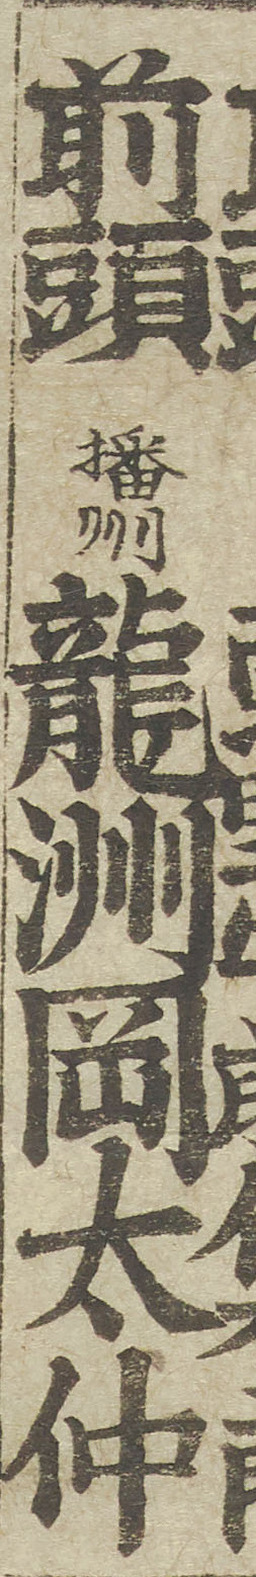前頭播州龍洲岡太仲
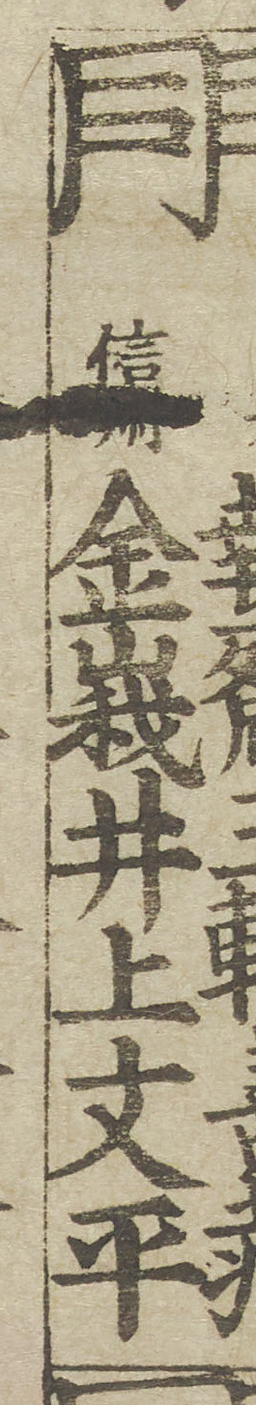同信州金峨井上文平
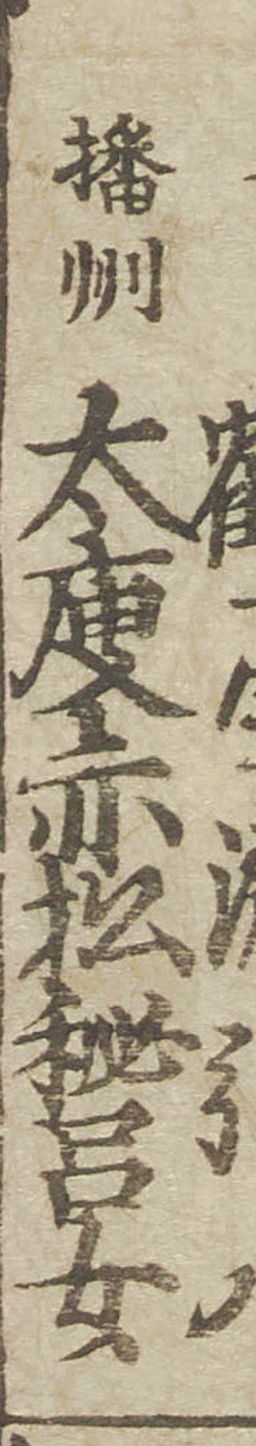同播州太痩赤松秘呂女
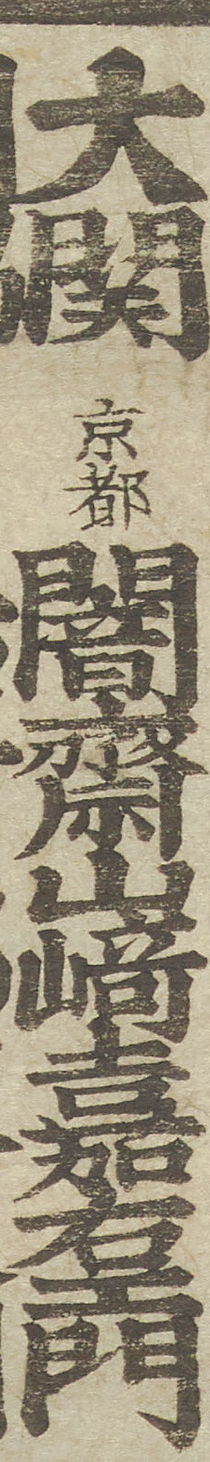大関京都闇斎山崎嘉右エ門
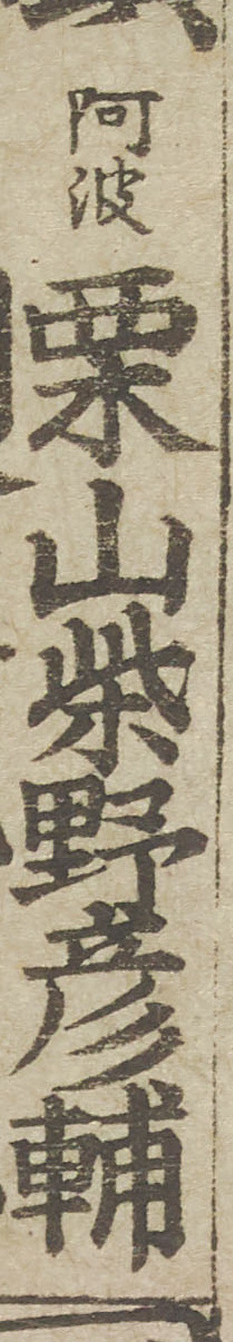前頭阿波栗山柴野彦輔
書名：儒者競
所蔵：東京大学総合図書館 General Library in the University of Tokyo, JAPAN
